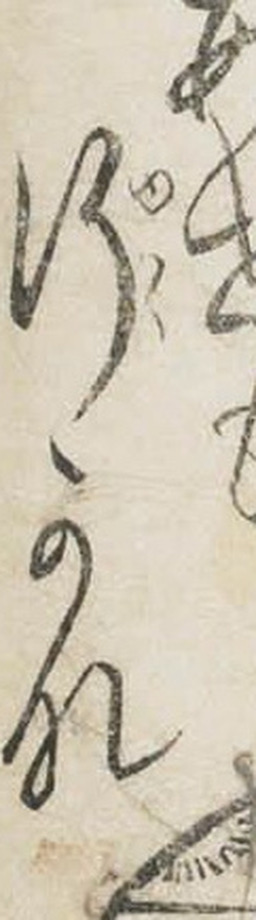行かな
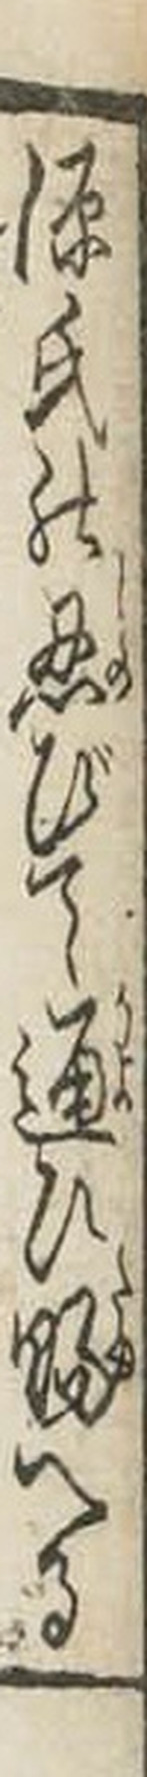源氏の忍びて通ひ賜へる
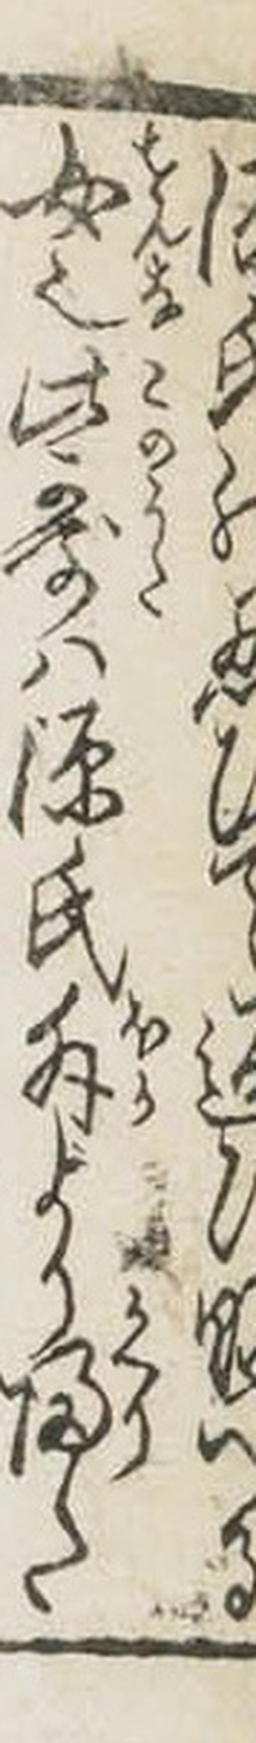女也此哥は源氏外より帰た
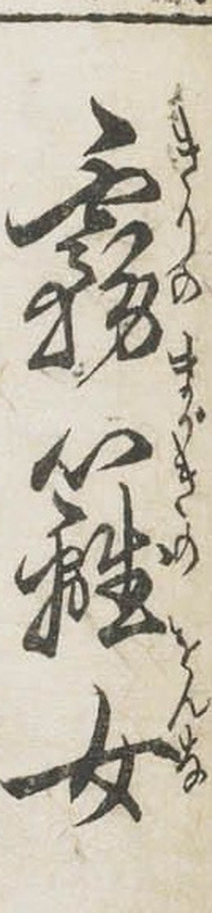霧籬女
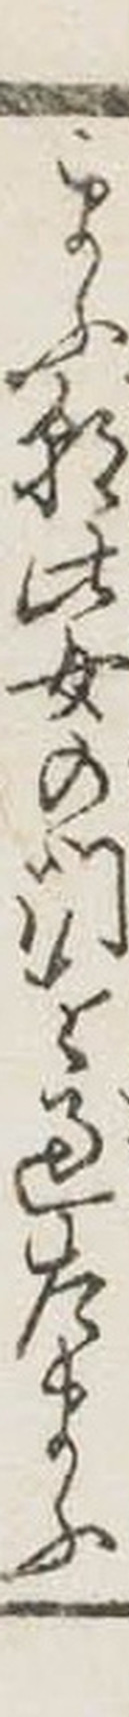まふ朝此女の門を過たまふ
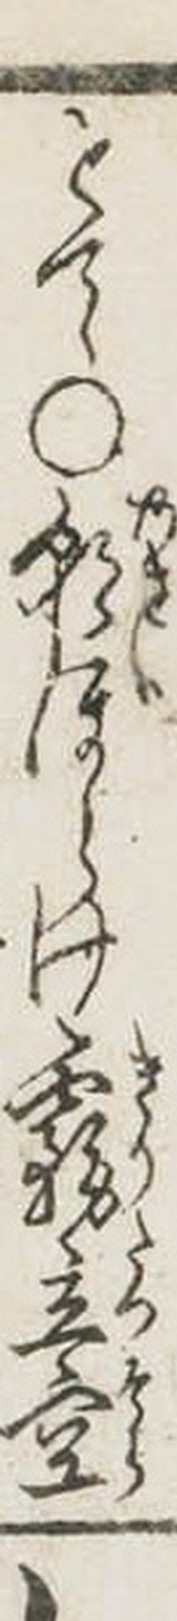とて○朝ぼらけ霧立空
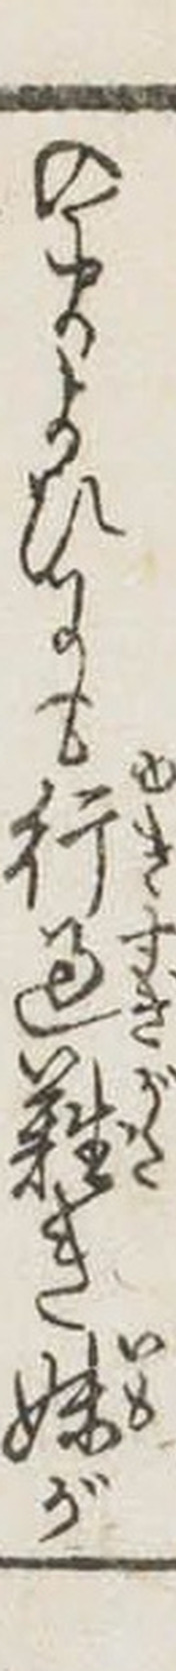のまよひにも行過難き妹が
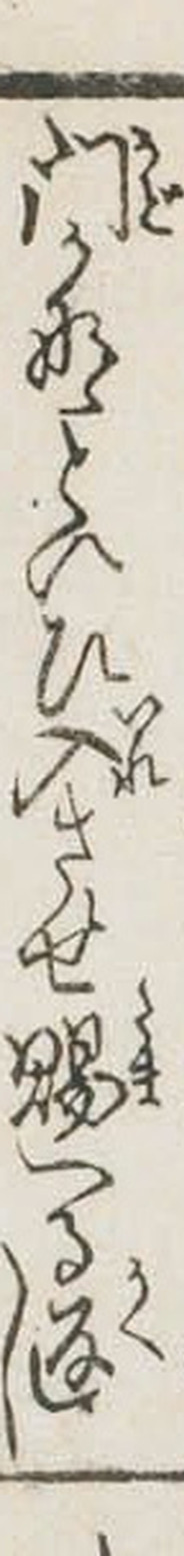門かなといひ入させ賜へる返し
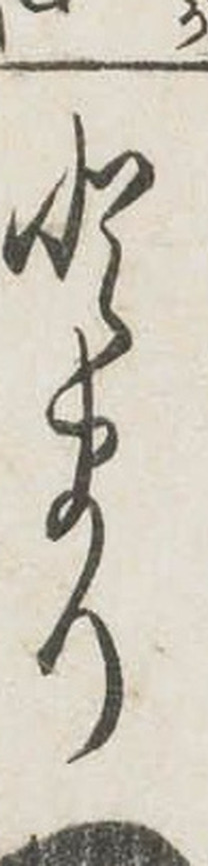とまり
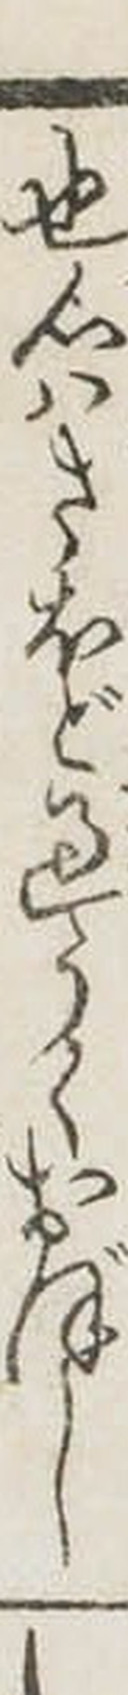也心はさほど過うくおぼし
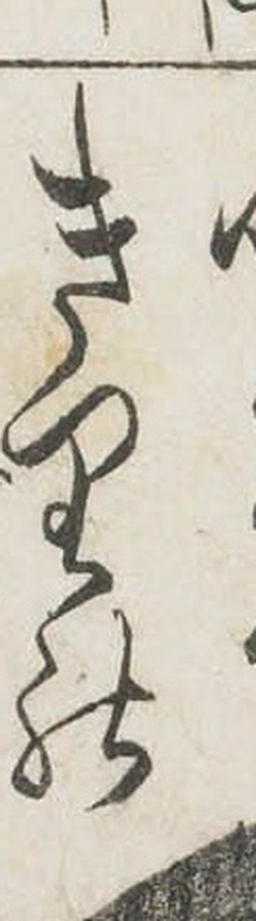きりの
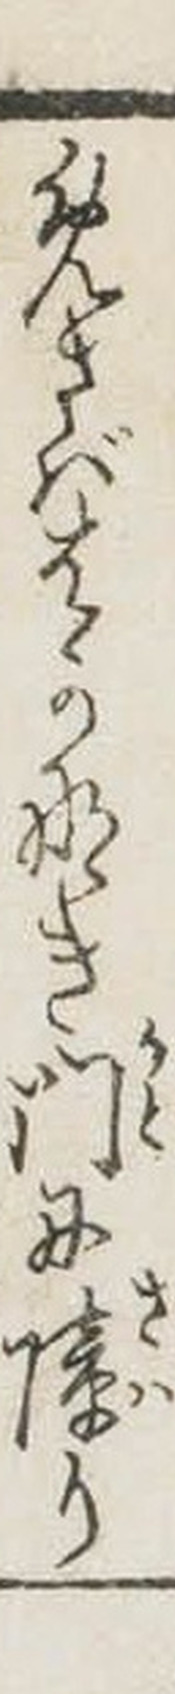めさばはかなき門に障り
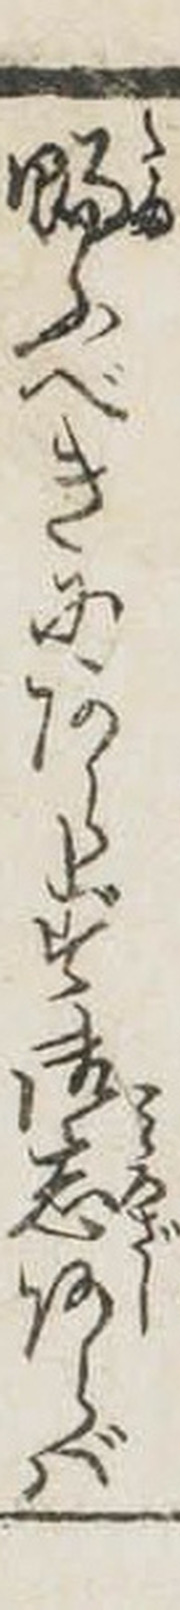賜ふべきにあらず御志あらば
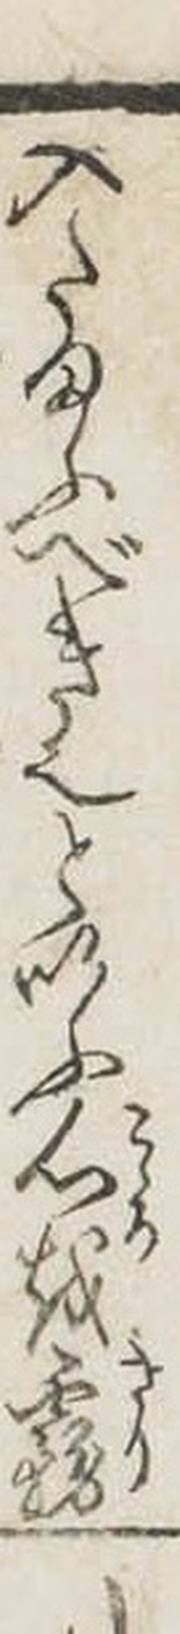入たまふべき也といふ心を霧
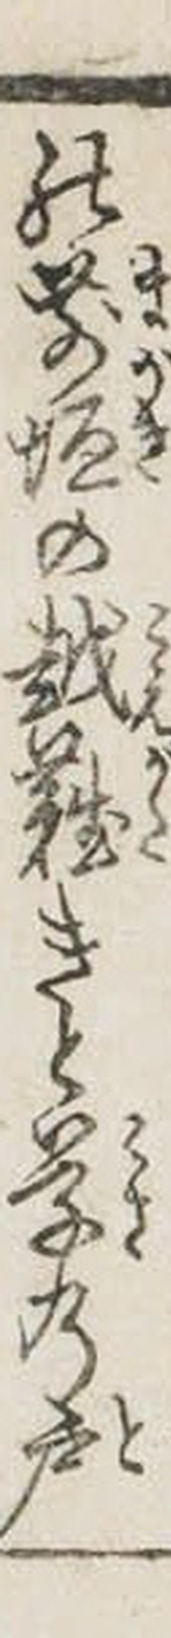の前垣の越難きと草の戸
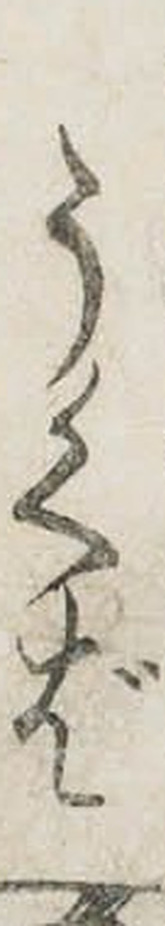うくば
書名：源氏百人一首
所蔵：東京学芸大学教育コンテンツアーカイブ
